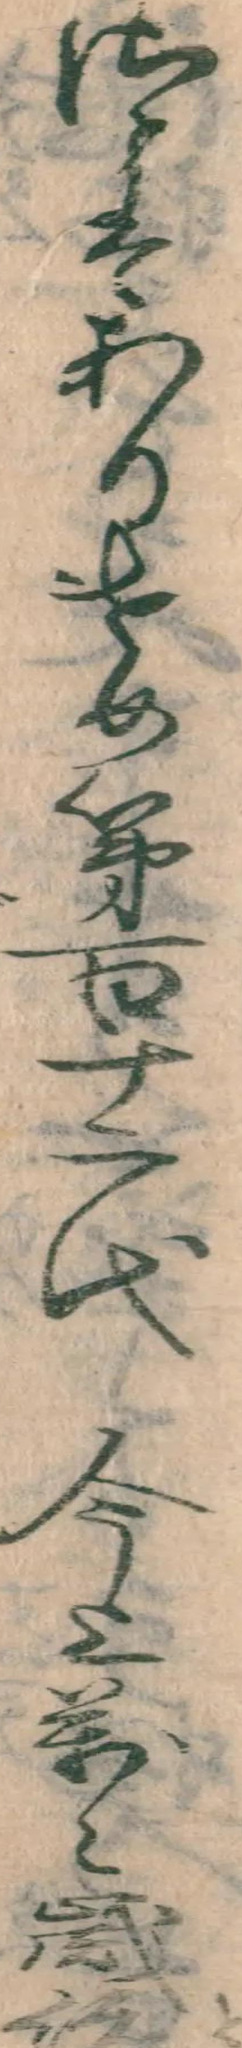さこそありけめ第百十二代今上萬々歳統御
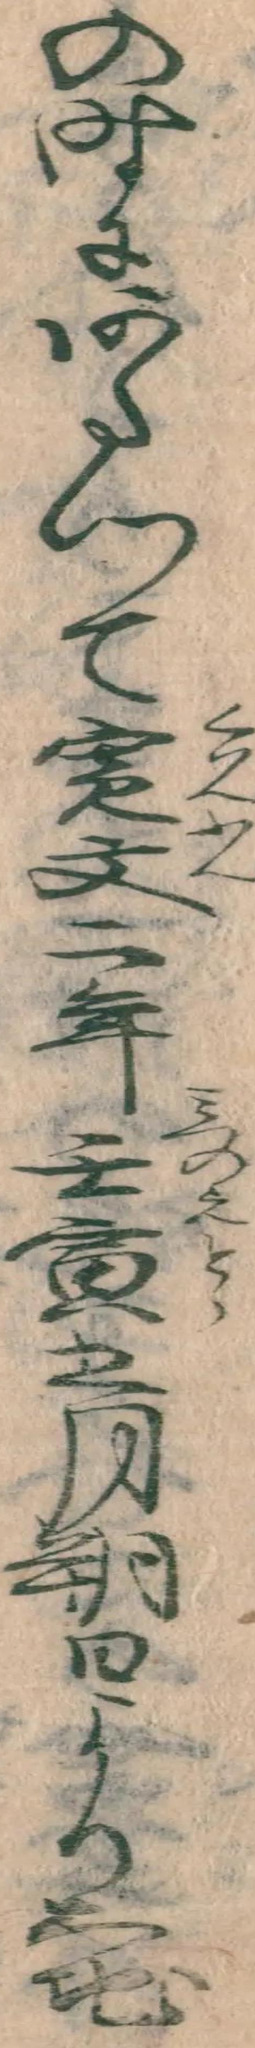の時にあたつて寛文二年壬寅五月朔日より大地
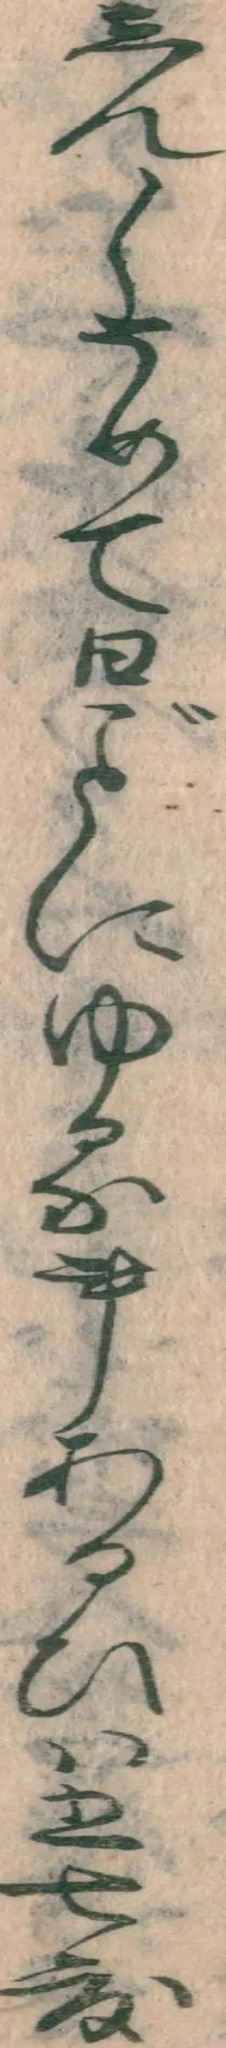しんしそめて日ごとにゆる事あるひは五七度
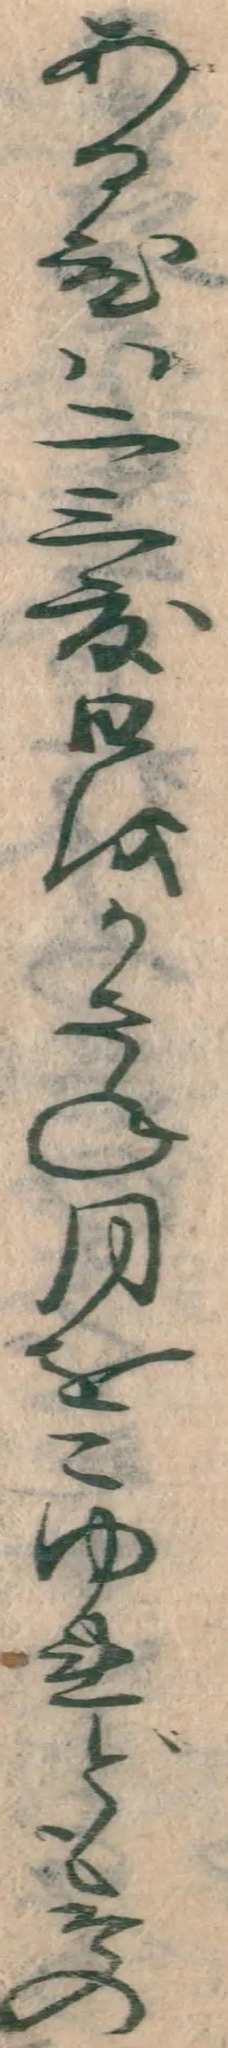あるひはニ三度日をかさね月をこゆれともその
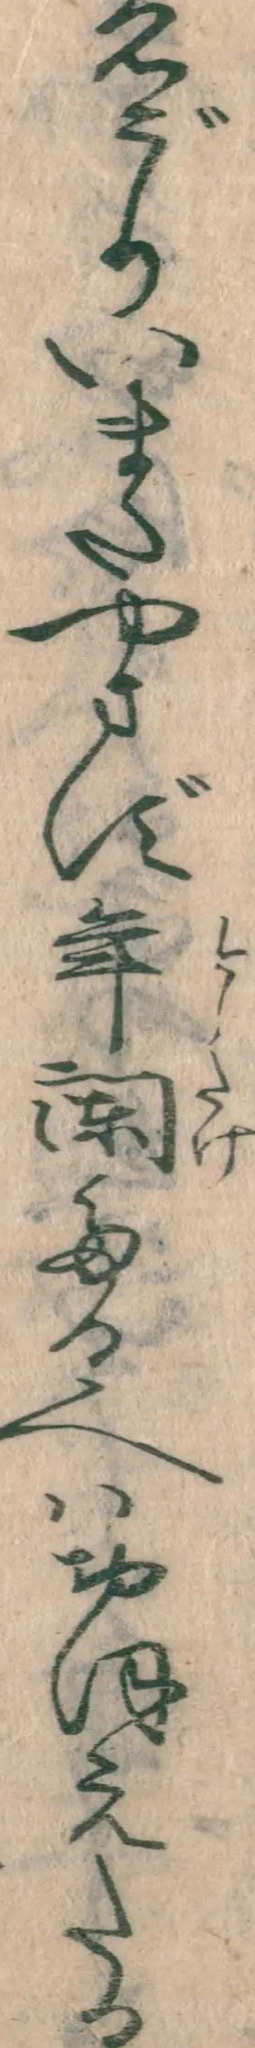名ごりいまたやまず年闌たる人はおほえたる
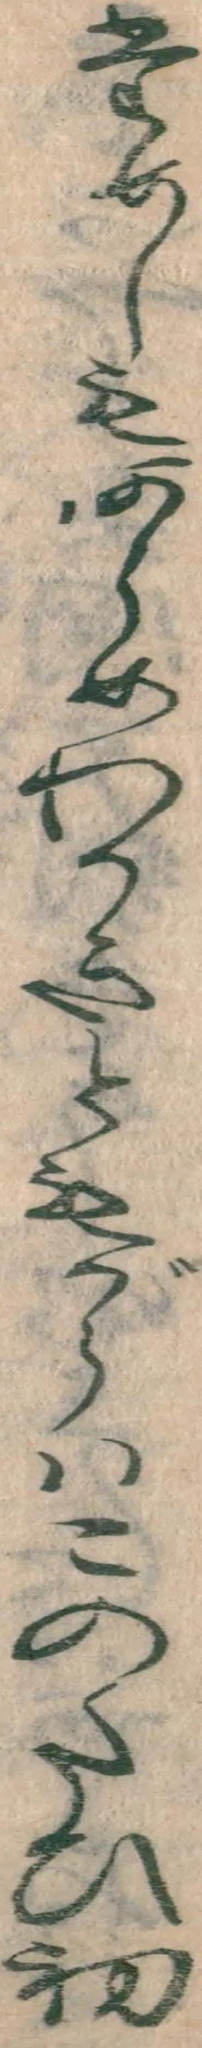ためしもあらめわかきともがらはこのたび初
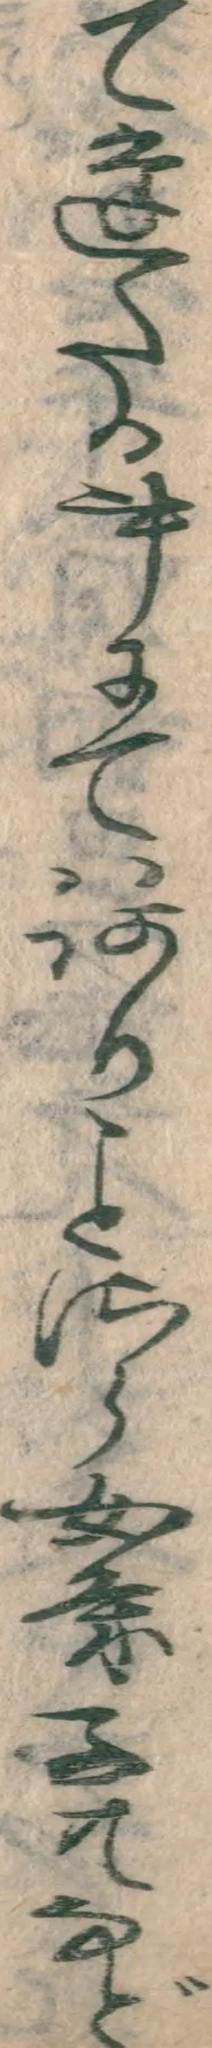て逢たか事にてはありことさら女房子共など
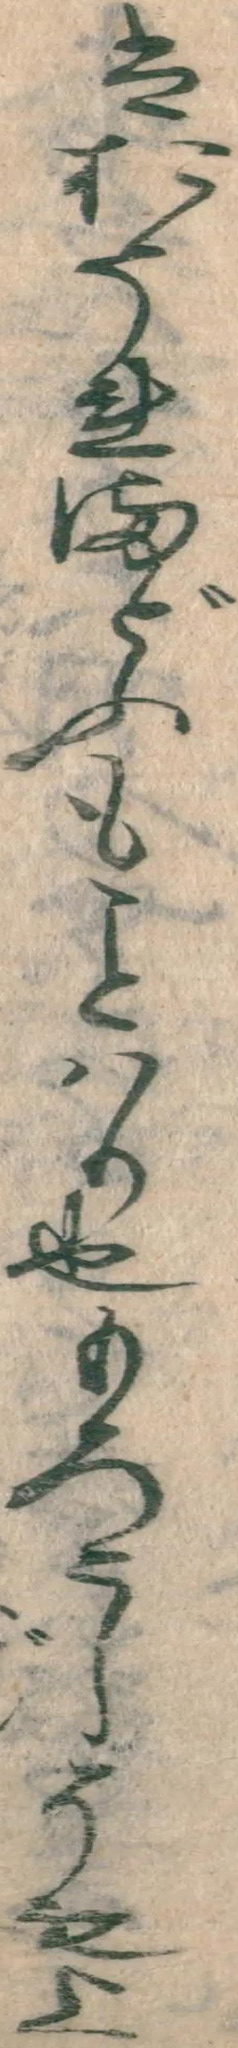はおそれまどふもことはり也もろこしにも上
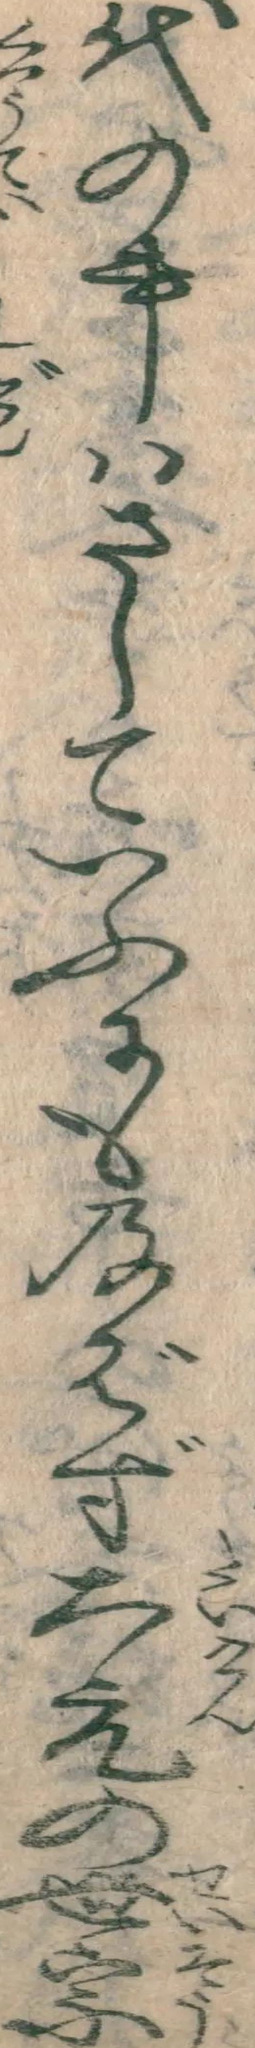代の事はさしていふにも及ばず大元の世宗
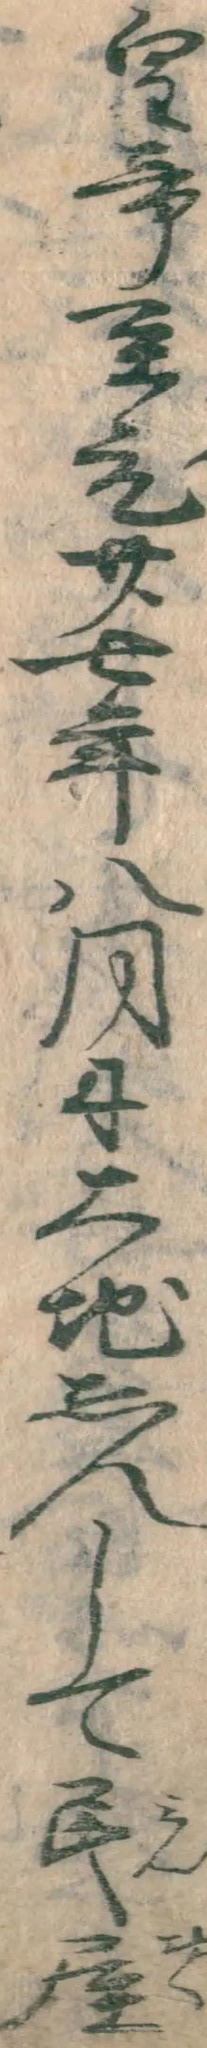皇帝至元廿七年八月に大地しんして民屋
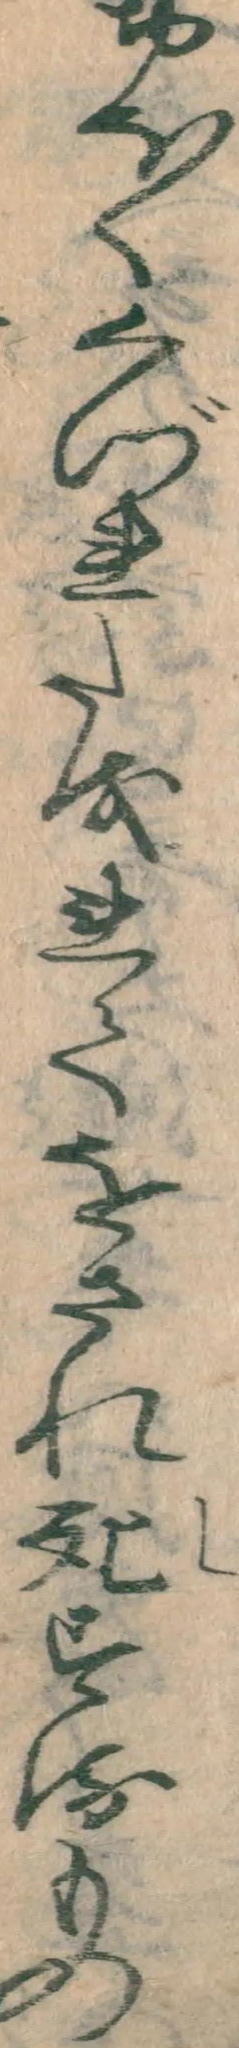おほくくづれたをれてをされ死するもの

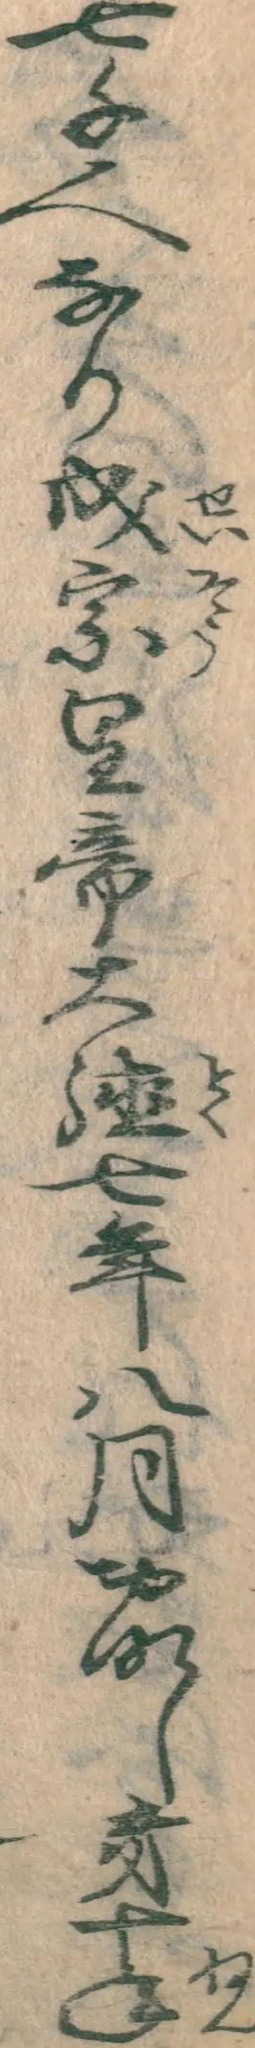七千人なり成宗皇帝大徳七年八月おなしき十年
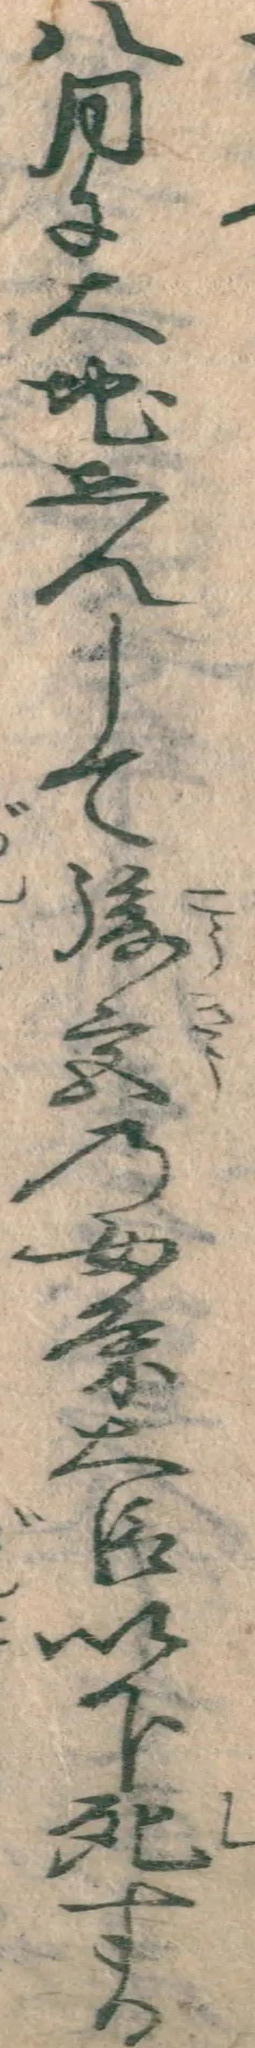八月に大地しんして後宮の女房大臣以下死する
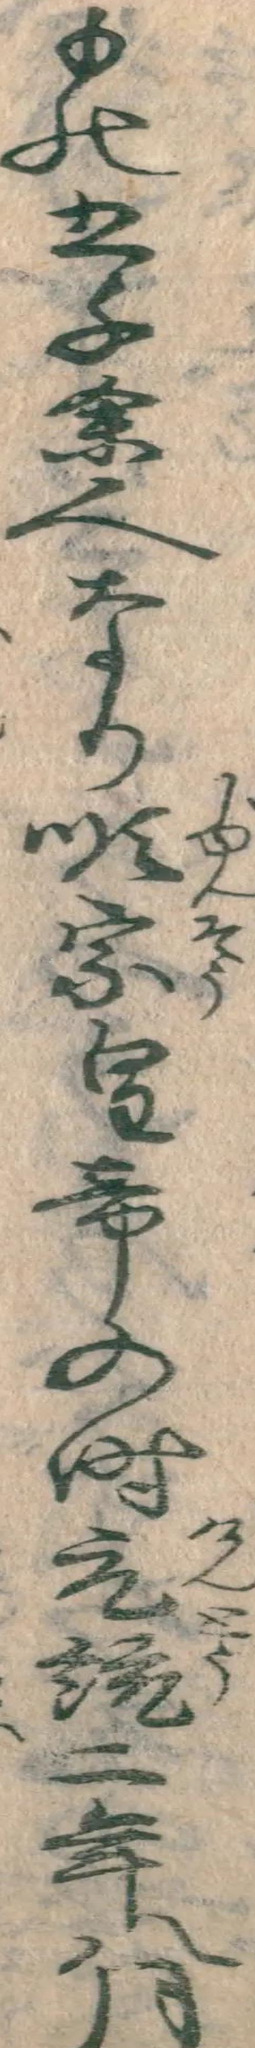もの五千余人なり順宗皇帝の時元統二年八月
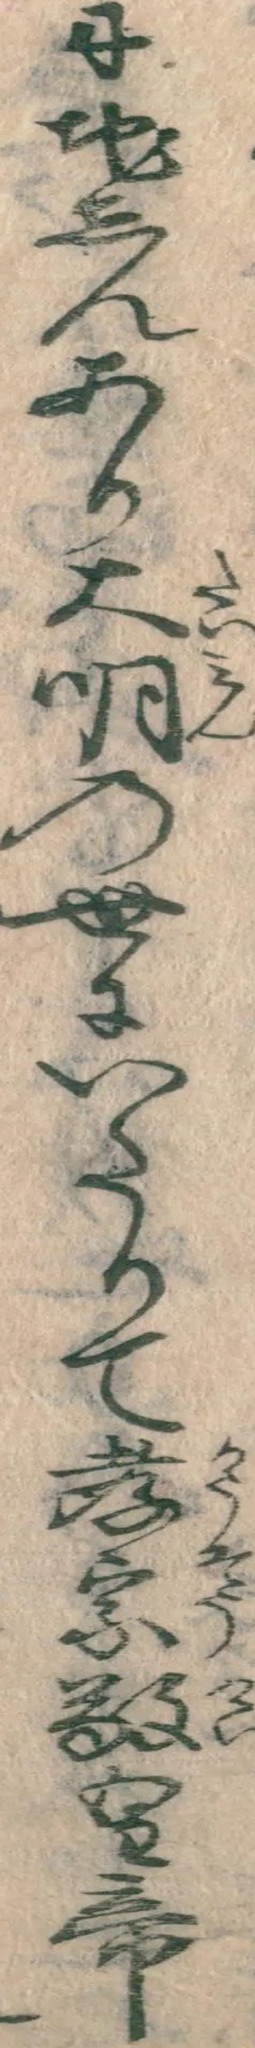に地しんあり大明の世にいたりて孝宗敬皇帝
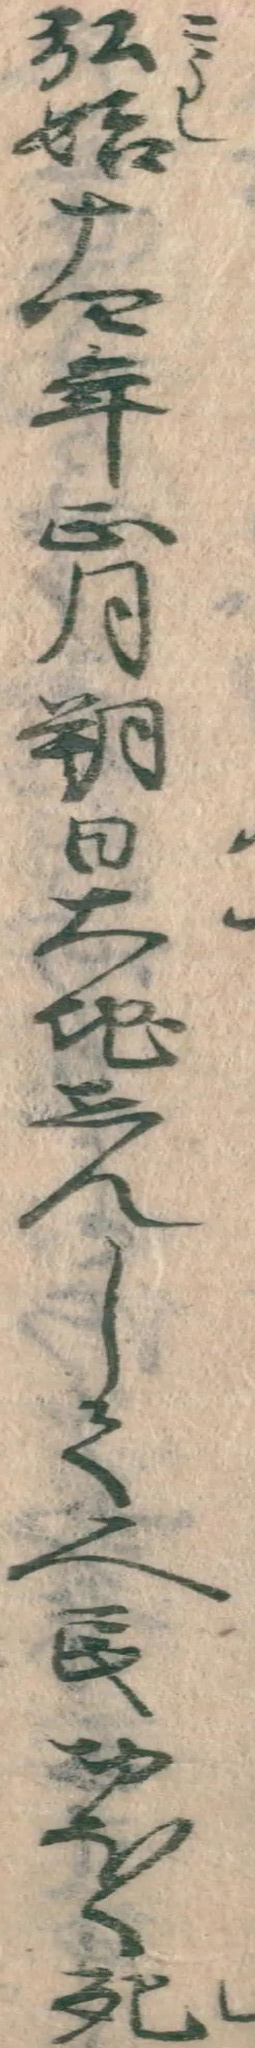弘始十四年正月朔日大地しんして人民おほく死
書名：艱難目異志. 上,下
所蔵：国立国会図書館 National Diet Library, JAPAN
